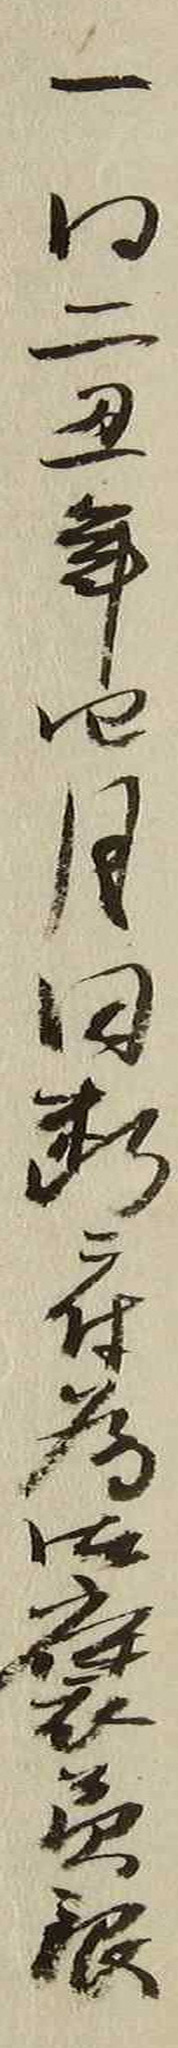一同二丑年四月同断ニ付為御褒美銀
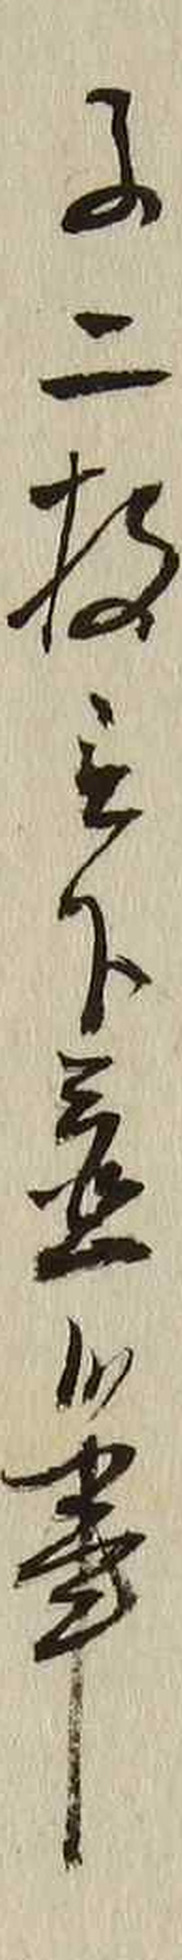子二枚被下置候事
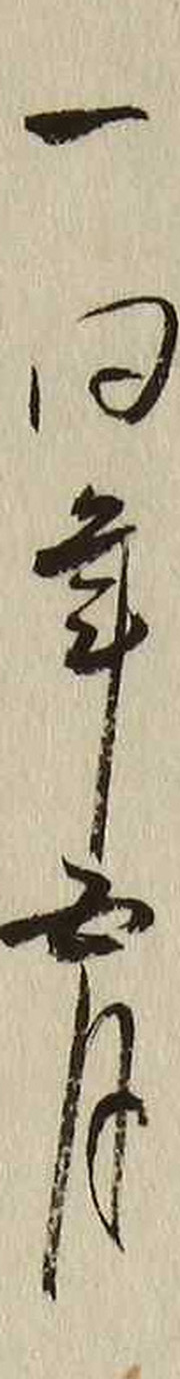一同年五月
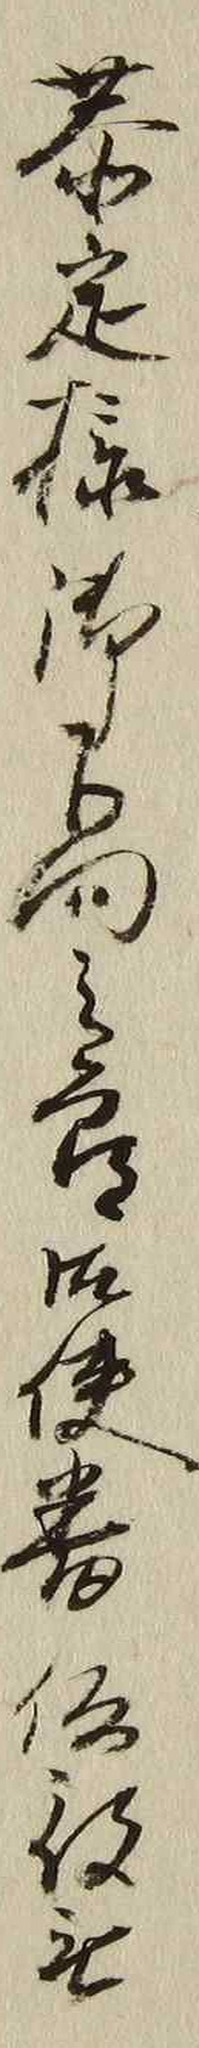恭定様御下向之節御使番仮役被
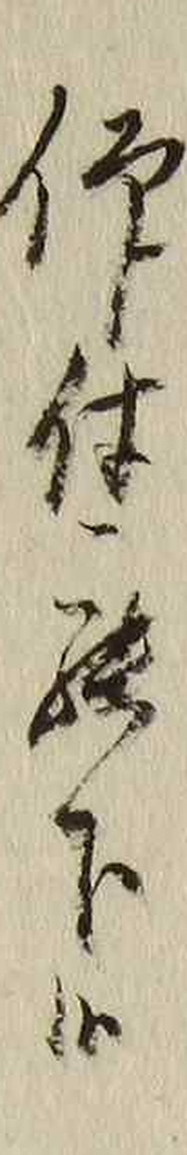仰付罷下候
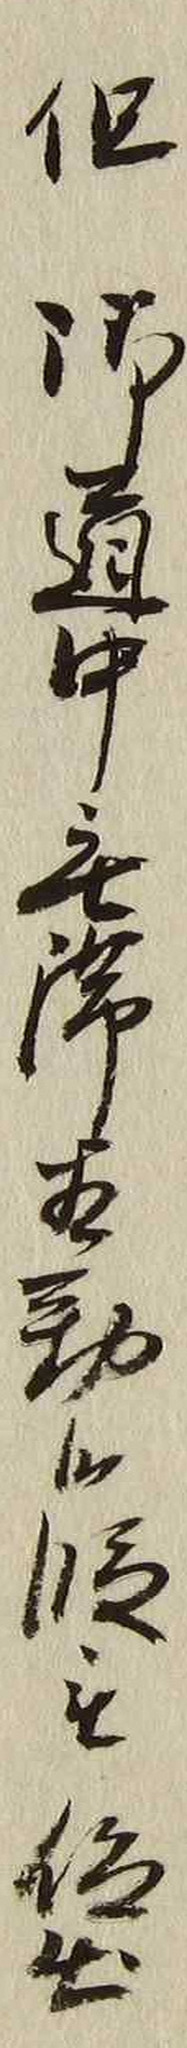但御道中無滞相勤候段被仰出
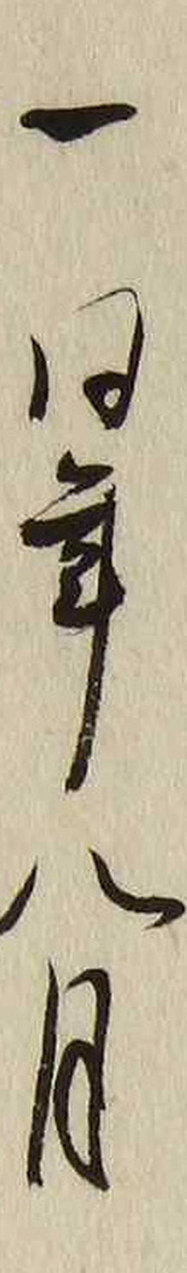一同年八月
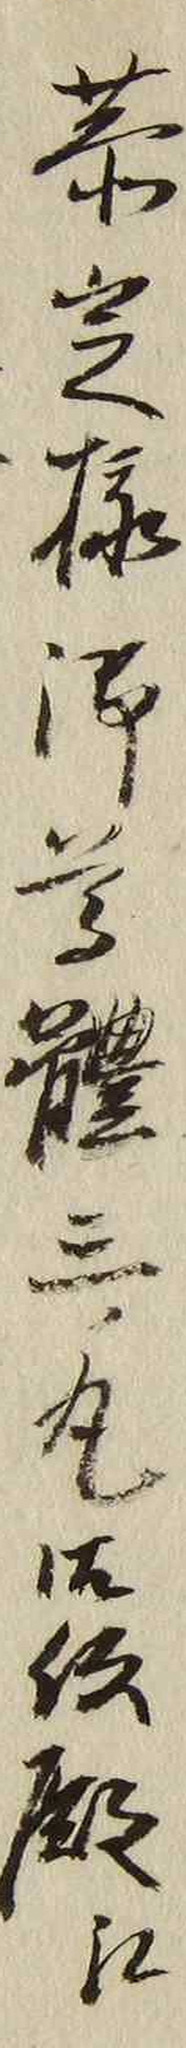恭定様御尊体三ノ丸御仮殿江
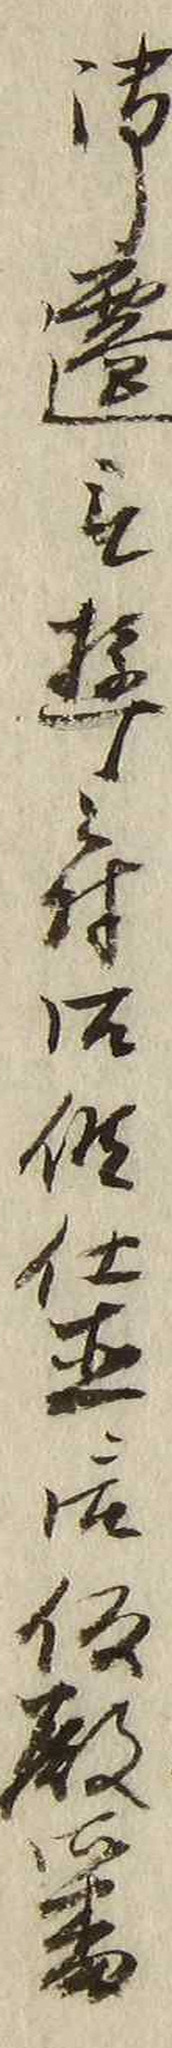御遷被遊候ニ付御供仕直ニ御仮殿御番

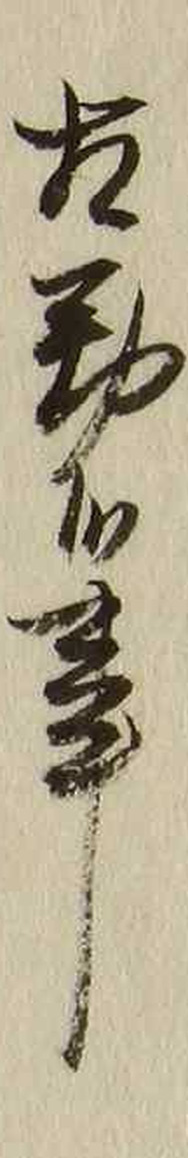相勤候事
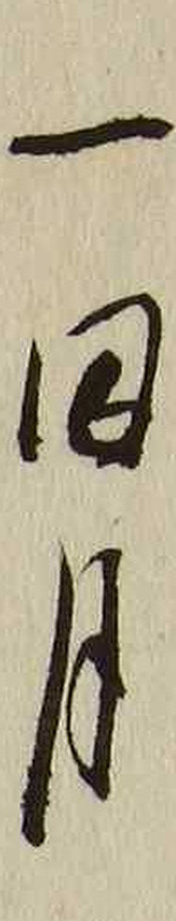一同月
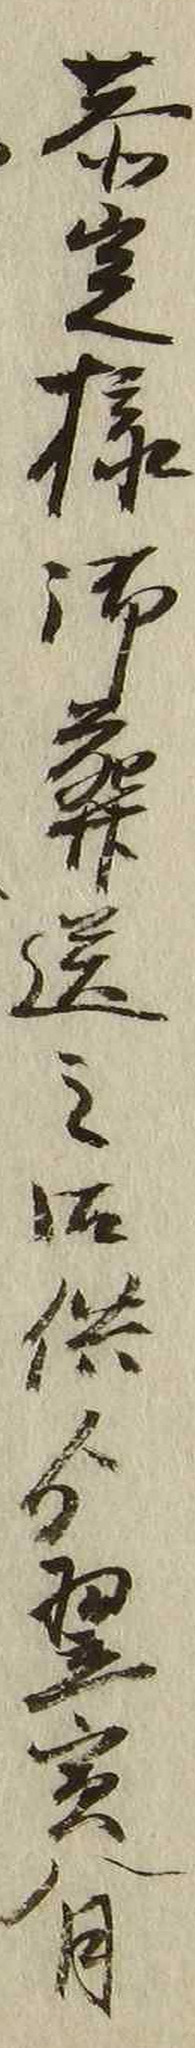恭定様御葬送之御供ゟ翌寅八月
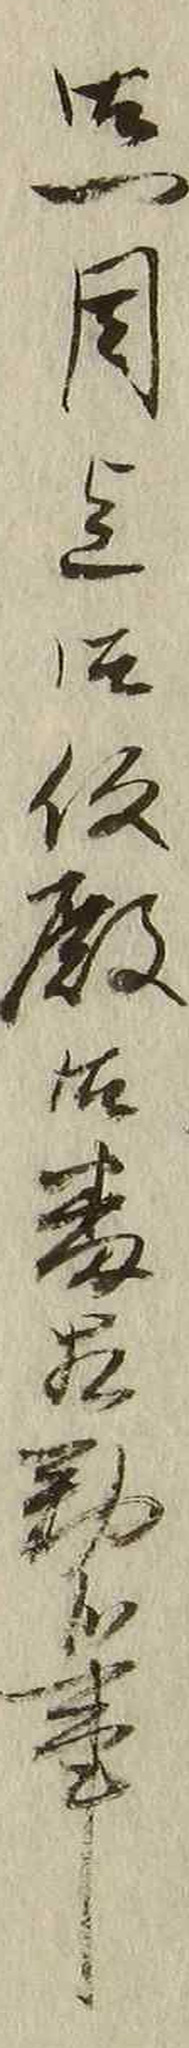御一周迄御仮殿御番相勤候事
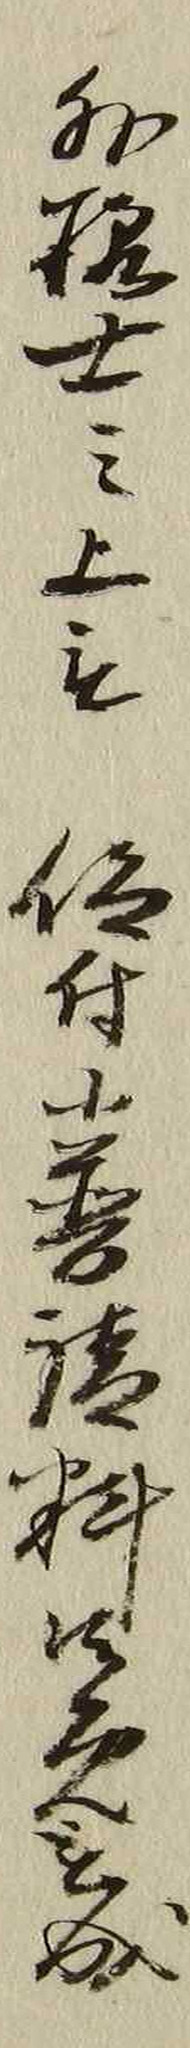外様士之上被仰付小普請料御免被成
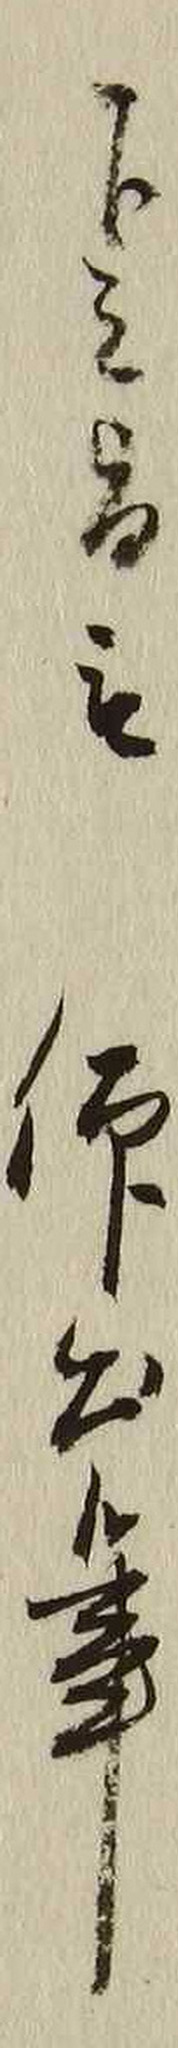下之旨被仰出候事
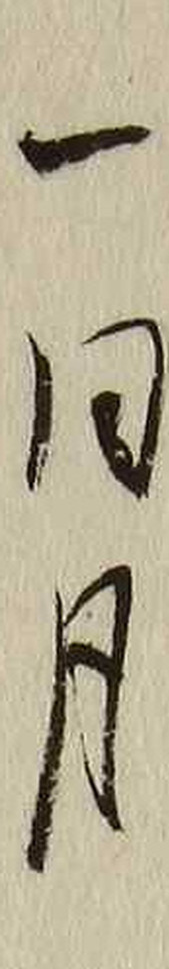一同月
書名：諸士系譜　巻之345　も之部1
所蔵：会津若松市立会津図書館
